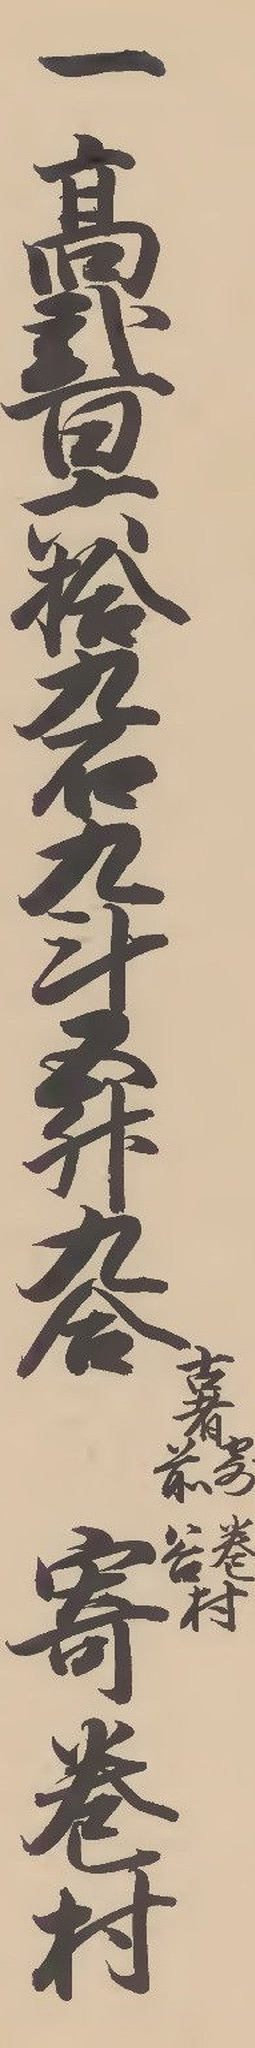一高弐百六拾九石九斗五升九合寄巻村

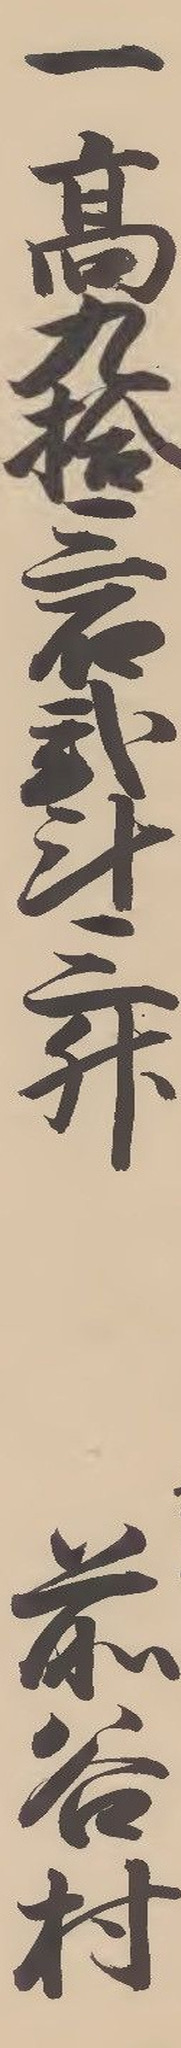一高九拾三石弐斗三升前谷村
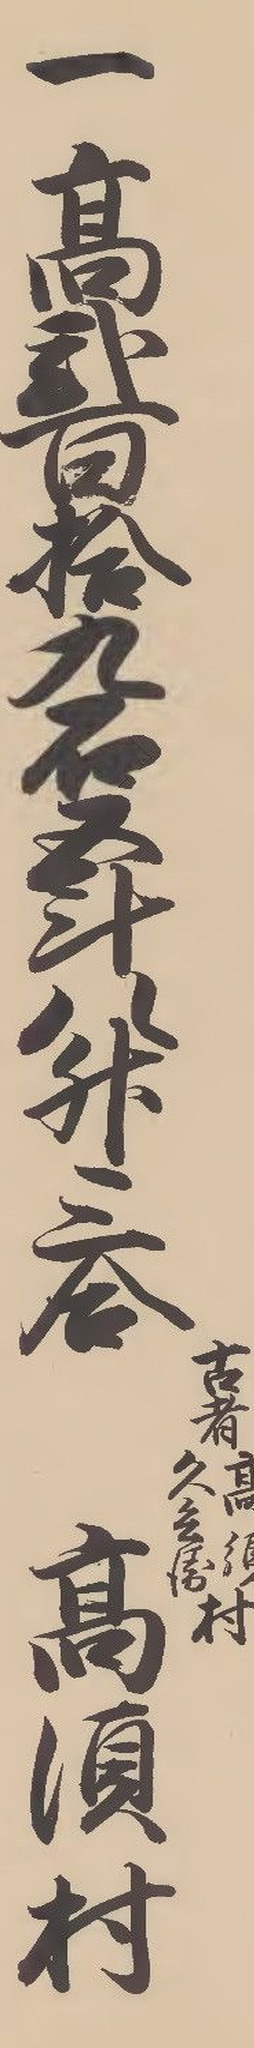一高弐百拾九石五斗八升三合高須村
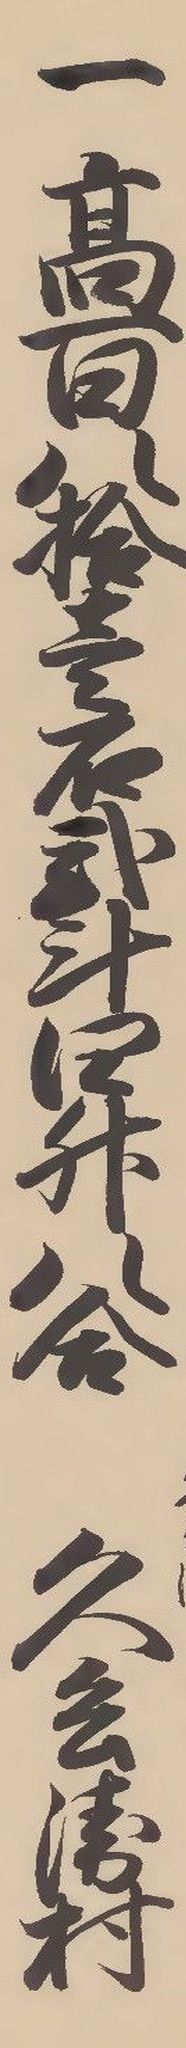一高百八拾壱石弐斗四升八合久兵衛村
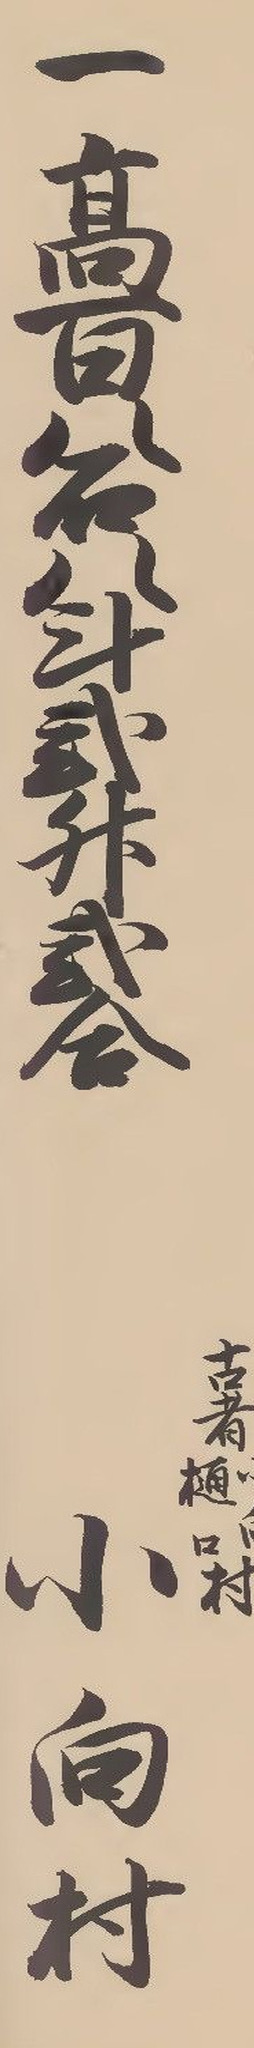一高百八石八斗弐升弐合小向村
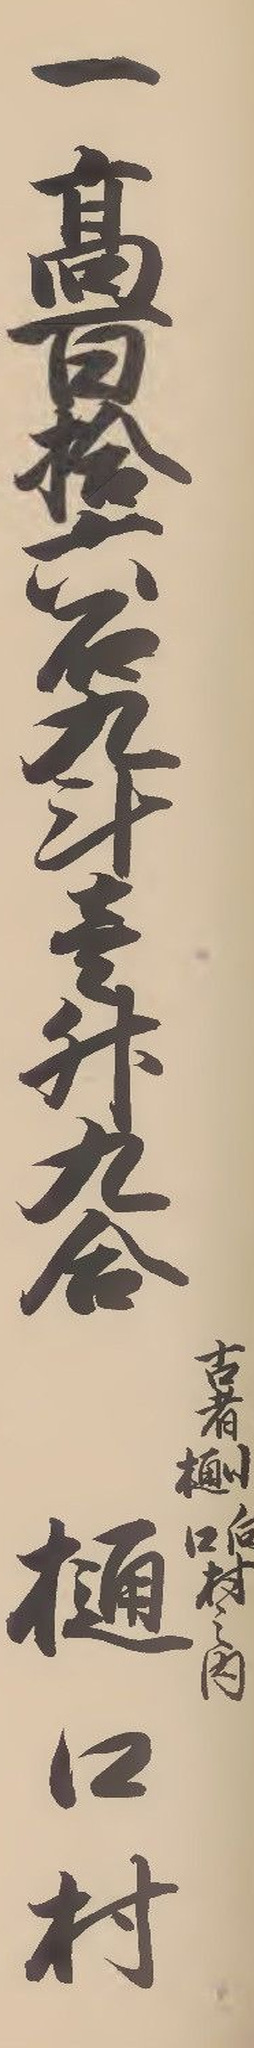一高百拾六石九斗壱升九合樋口村
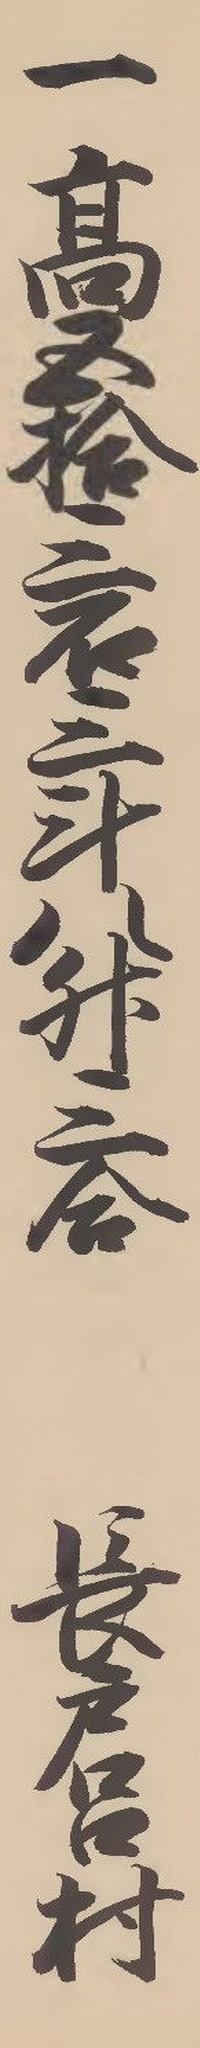一高五拾三石三斗八升三合長戸呂村
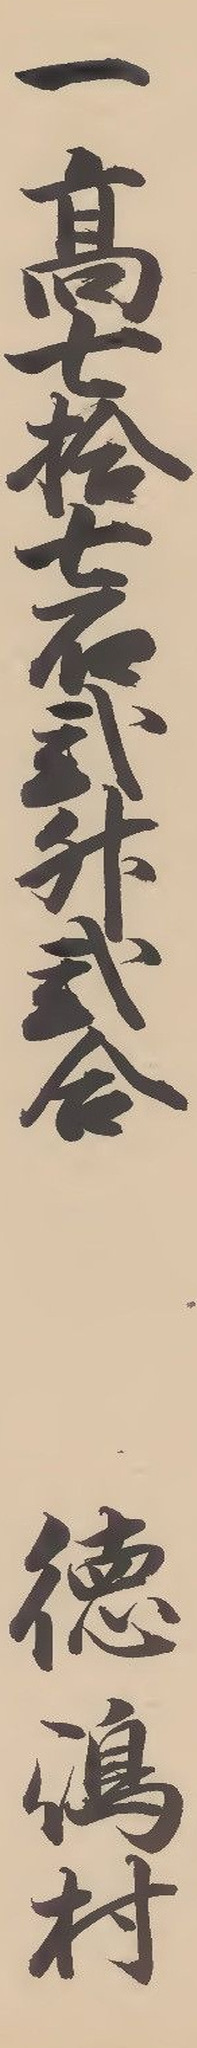一高七拾七石弐升弐合徳嶋村
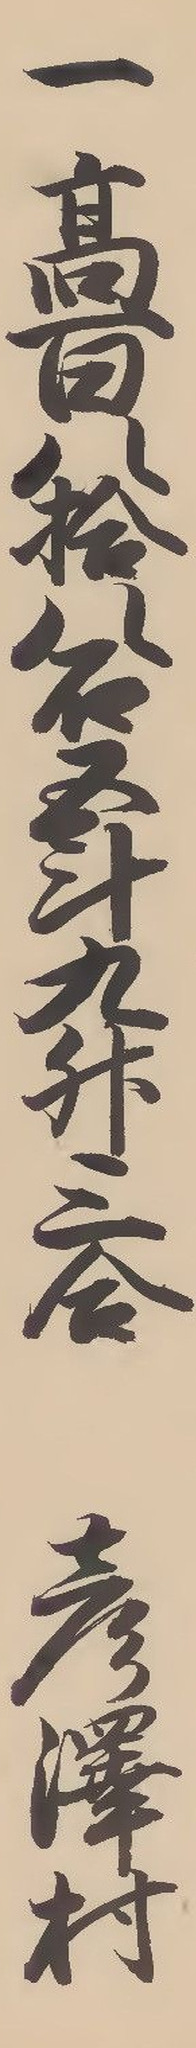一高百八拾八石五斗九升三合彦澤村

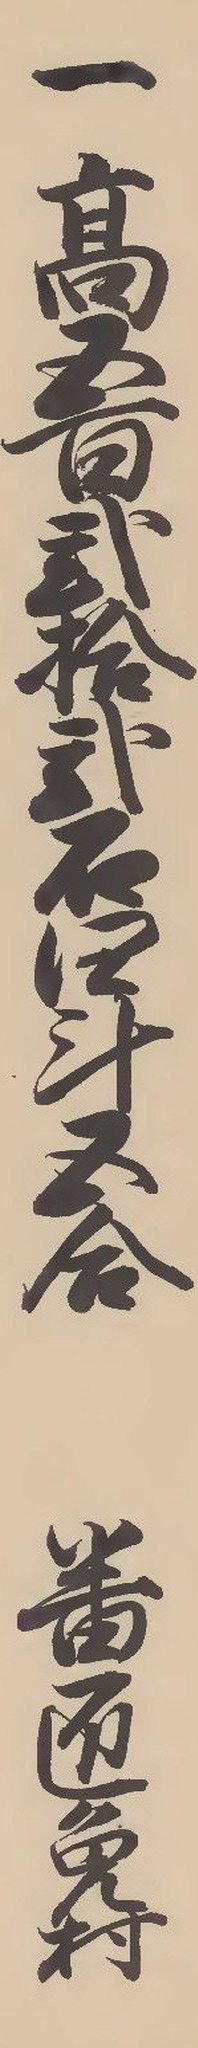一高五百弐拾弐石四斗五合番匠免村
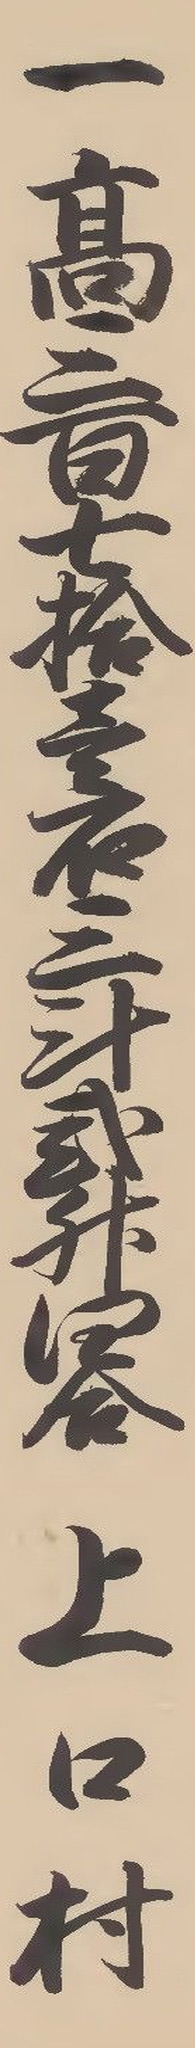一高三百七拾壱石三斗弐升四合上口村
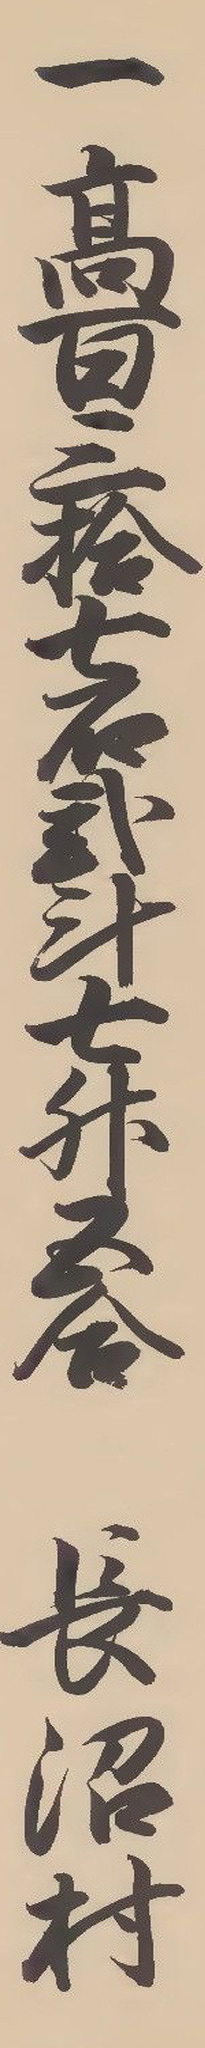一高百三拾七石弐斗七升五合長沼村
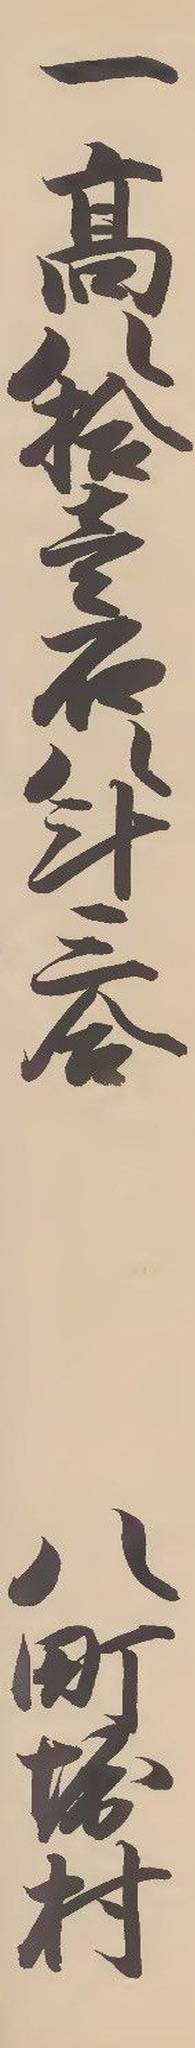一高八拾壱石八斗三合八町堀村
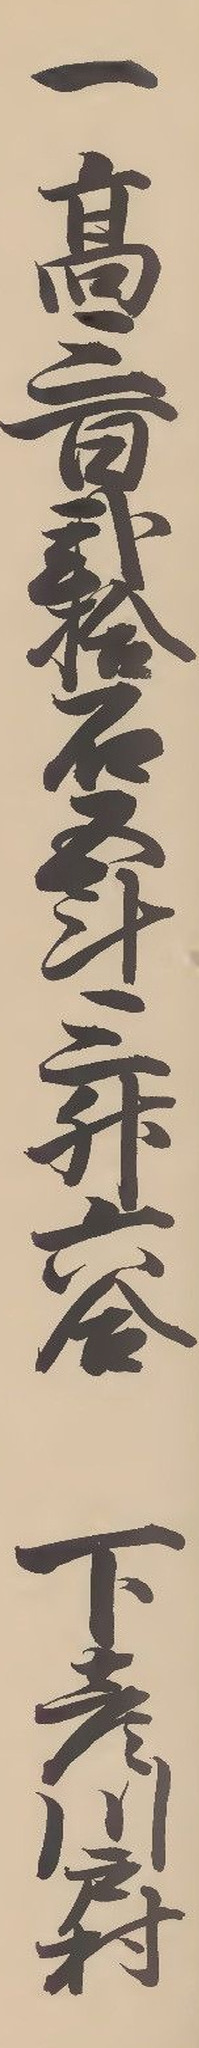一高三百弐拾石五斗三升六合下彦川戸村
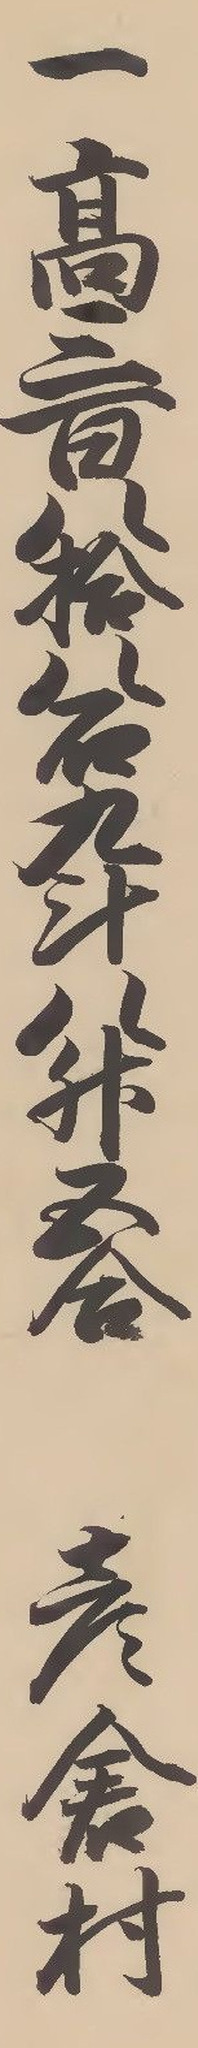一高三百八拾八石九斗八升五合彦倉村
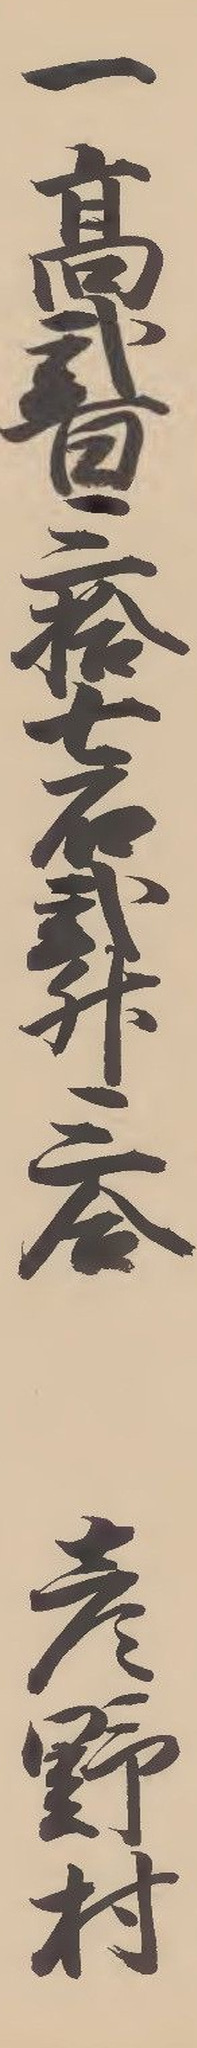一高弐百三拾七石弐升三合彦野村
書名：武蔵国郷帳　下
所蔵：国立公文書館 National Archives of Japan
